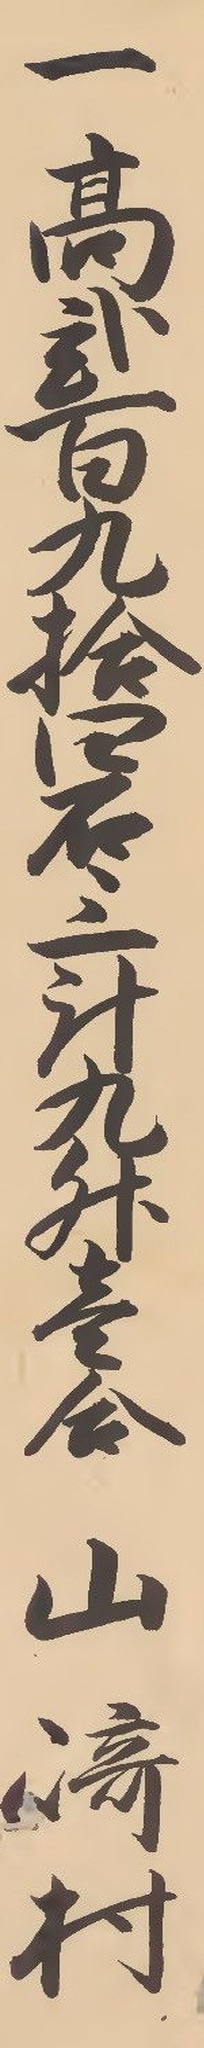一高弐百九拾四石三斗九升壱合山崎村
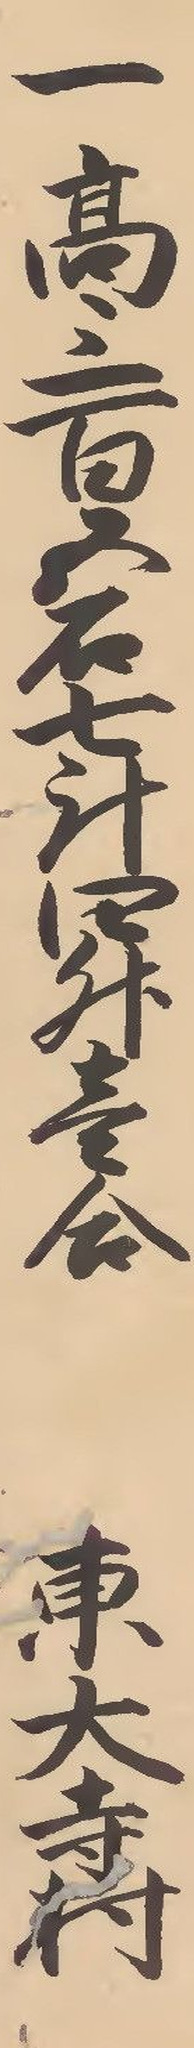一高三百五石七斗四升壱合東大寺村

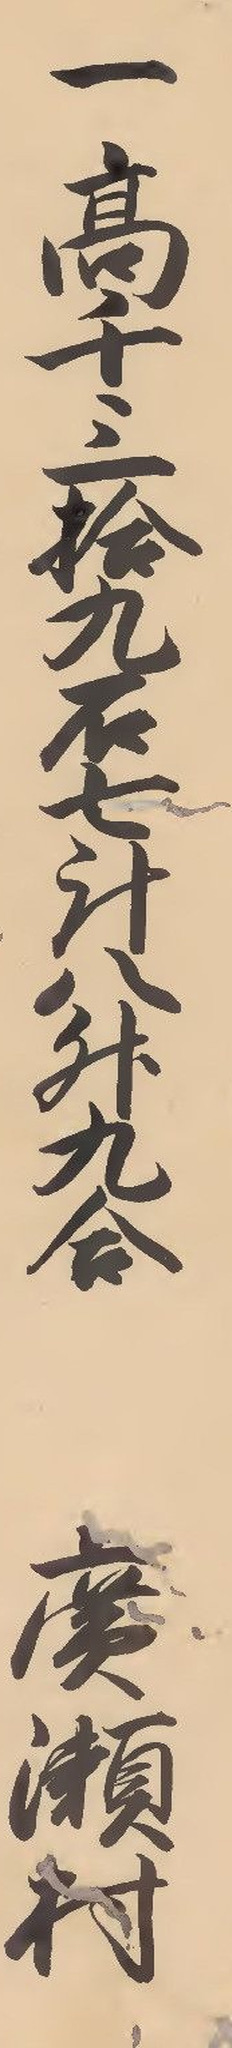一高千三拾九石七斗八升九合広瀬村
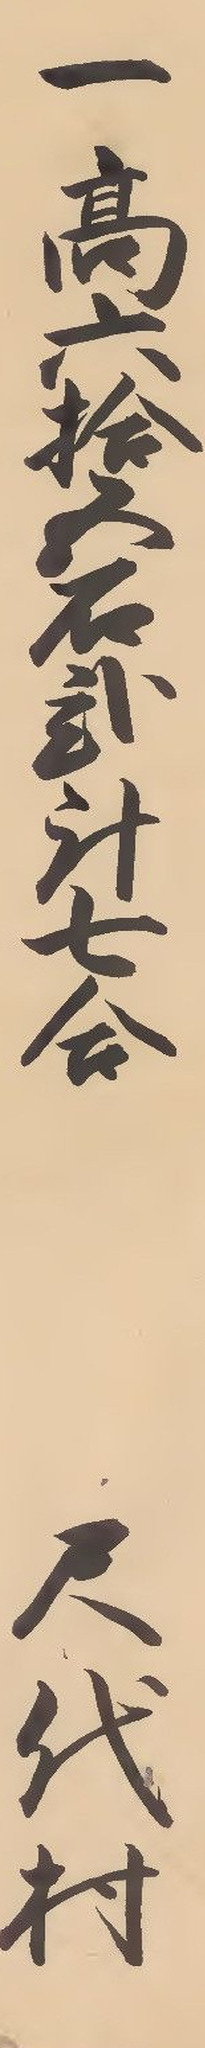一高六拾五石弐斗七合尺代村
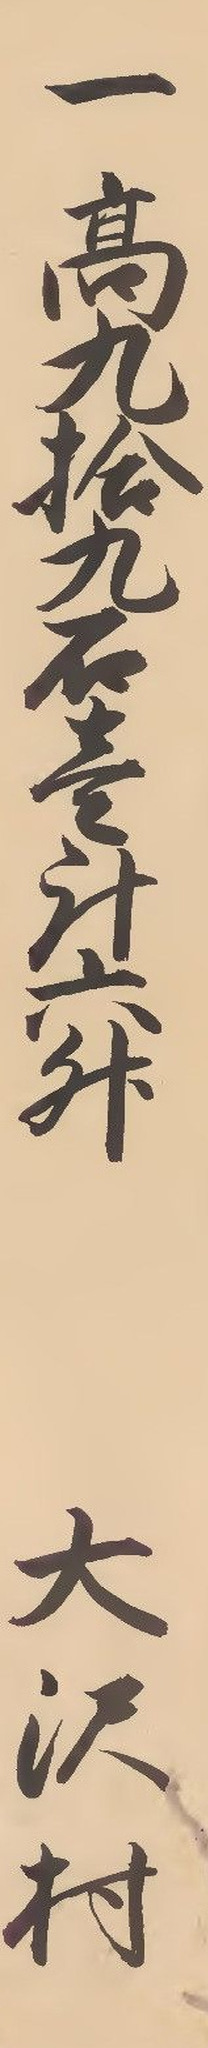一高九拾九石壱斗六升大沢村
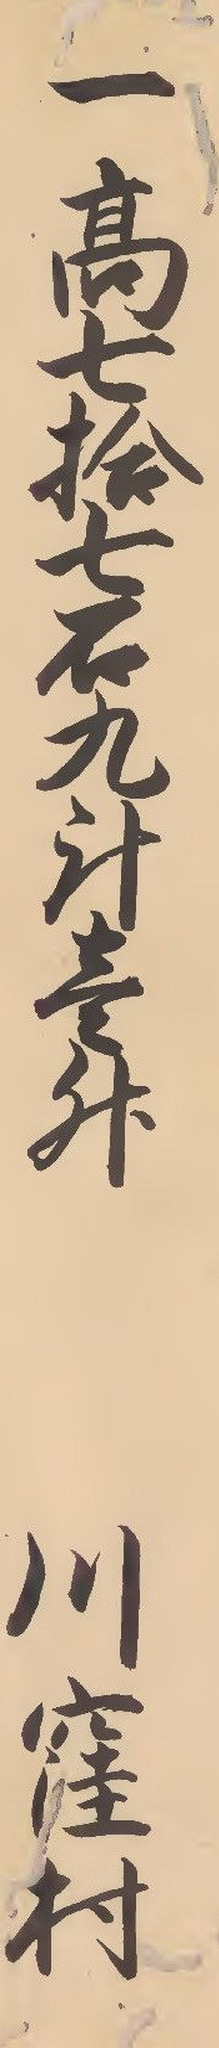一高七拾七石九斗壱升川窪村
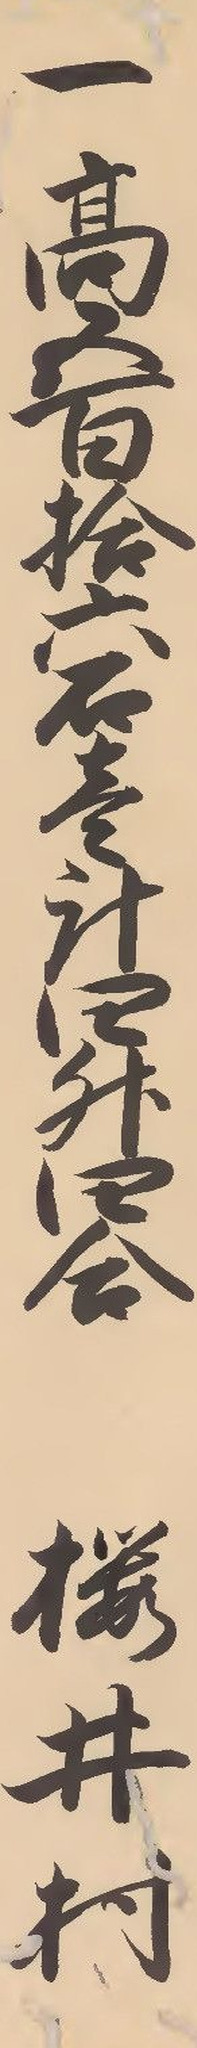一高五百拾六石壱斗四升四合桜井村
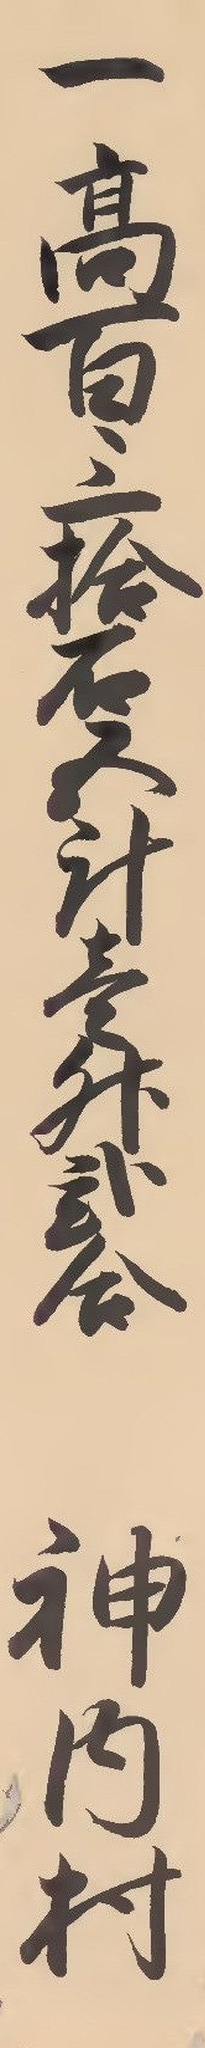一高百三拾石五斗壱升弐合神内村
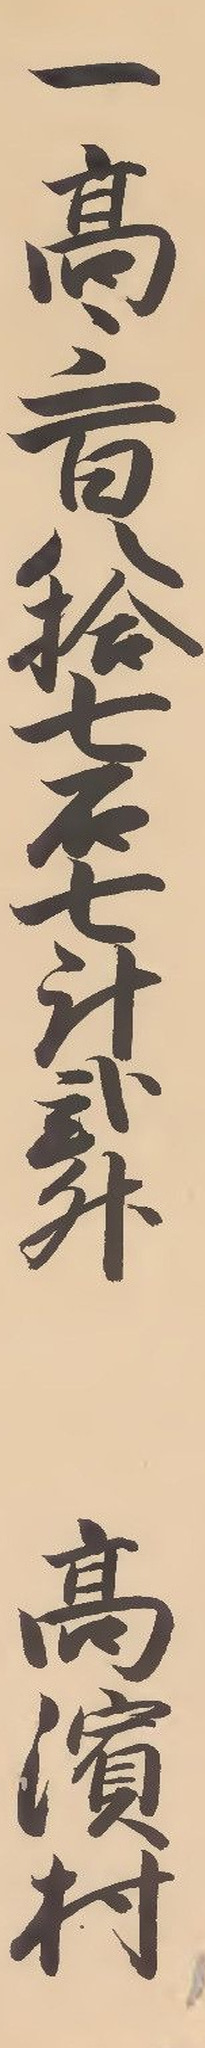一高三百八拾七石七斗弐升高浜村
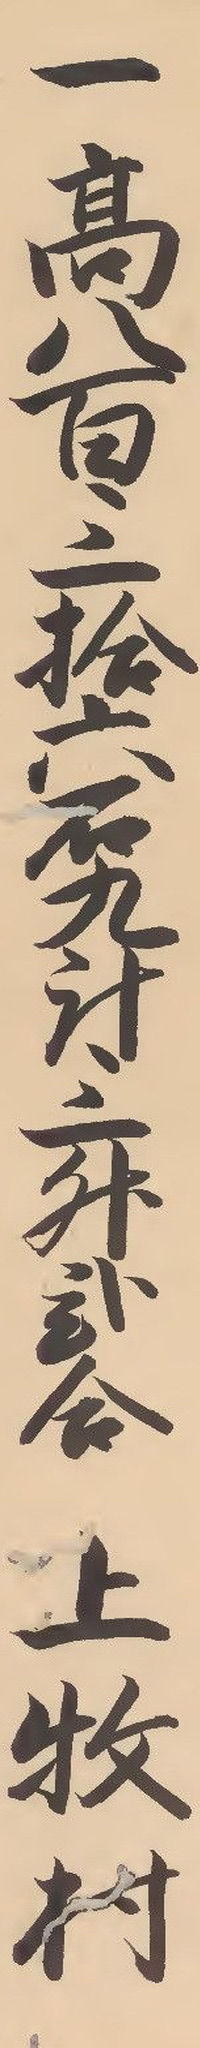一高八百三拾六石九斗三升弐合上牧村

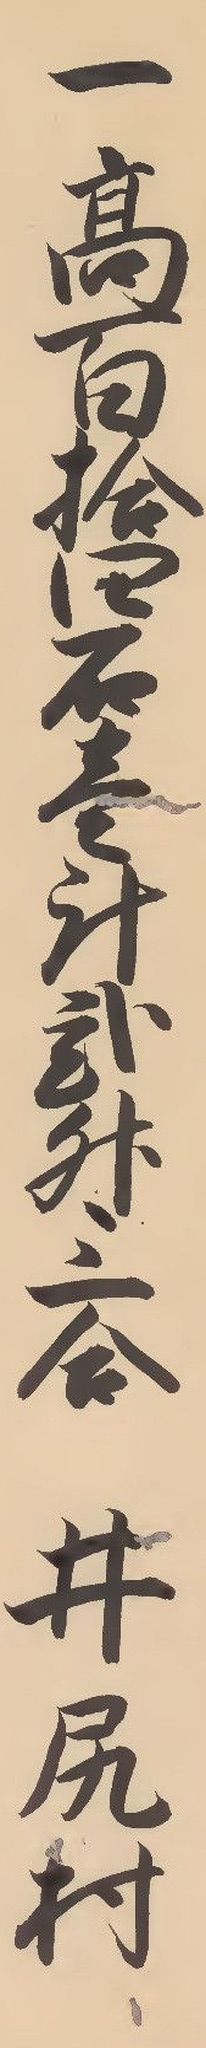一高百拾四石壱斗弐升三合井尻村
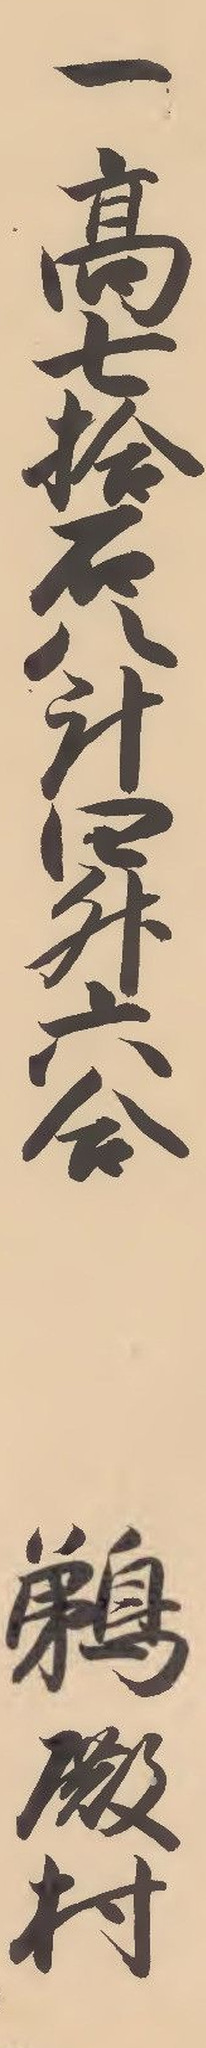一高七拾石八斗四升六合鵜殿村
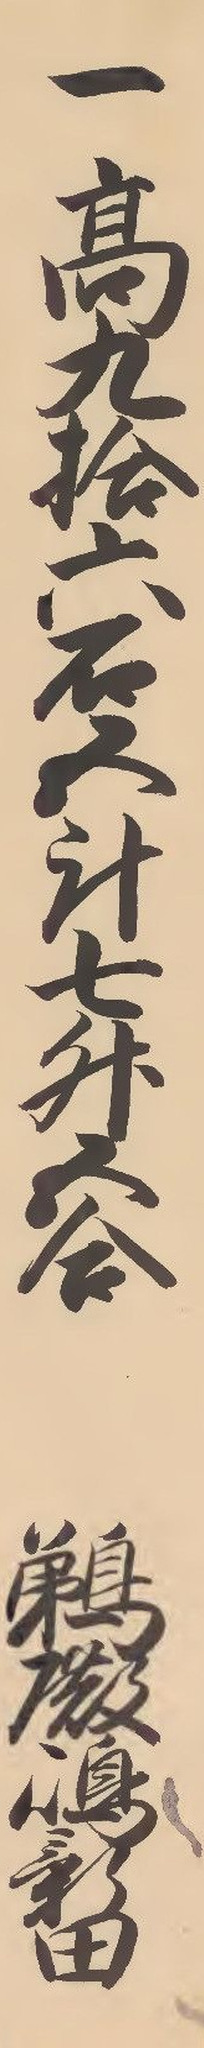一高九拾六石五斗七升五合鵜殿嶋新田
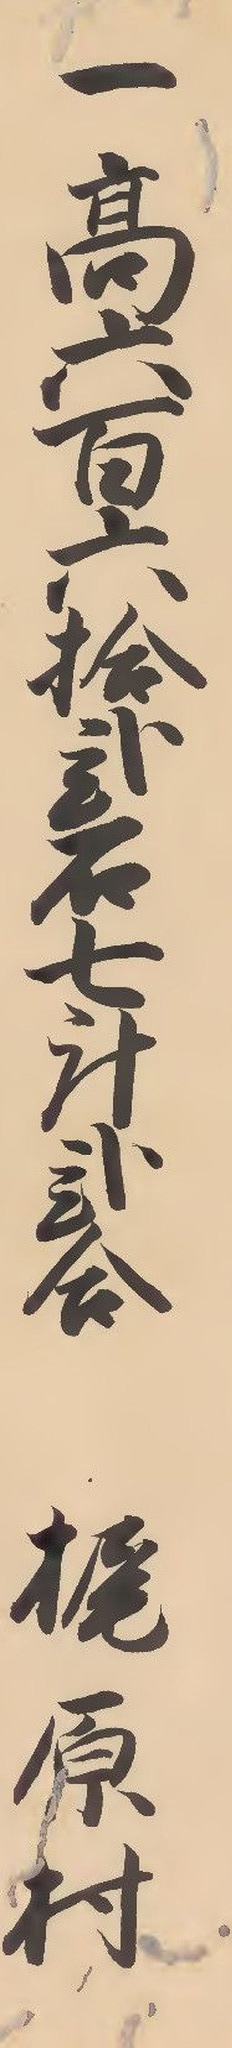一高六百六拾弐石七斗弐合梶原村
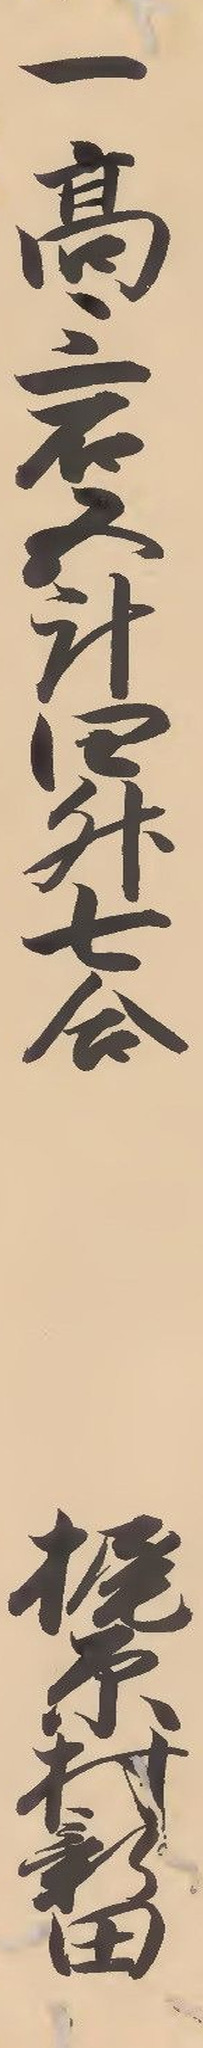一高三石五斗四升七合梶原村新田
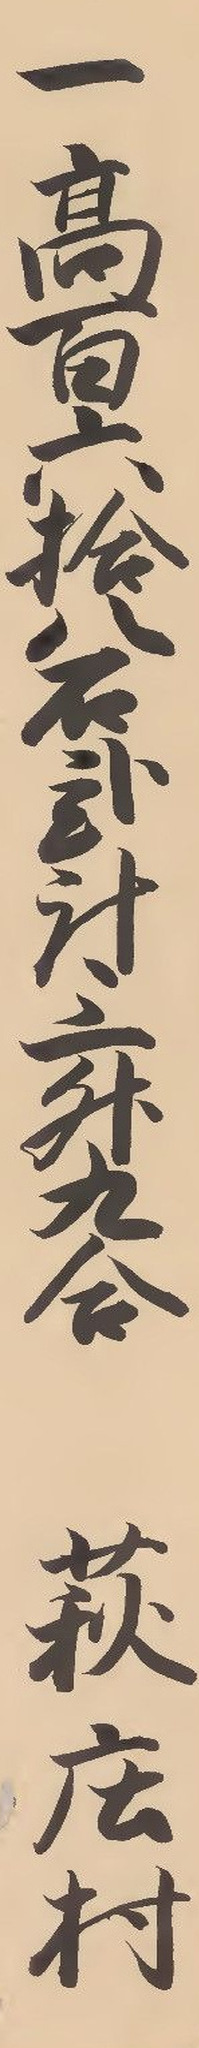一高百六拾八石弐斗三升九合萩庄村
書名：摂津国郷帳
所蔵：国立公文書館 National Archives of Japan
